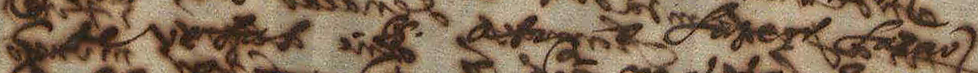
E se vosas .ss. asy o fizerē farão
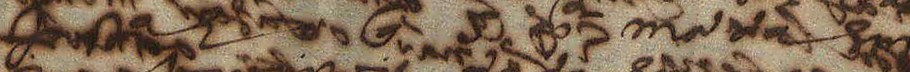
Iusta E o q̄ _ _te māda Em
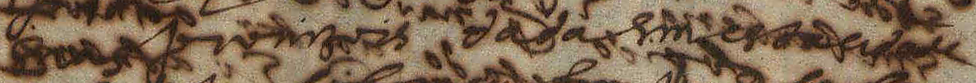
suas prouisois dada Em esta cidade
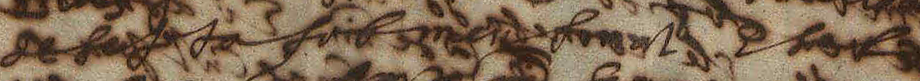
de septa sob meu sinal E seLo
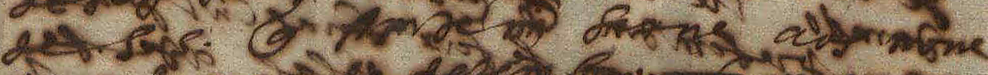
de 5_5. q̄ Amto mīz s_ne aos noue
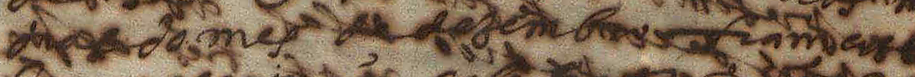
dias do mes de dezembro framcisco
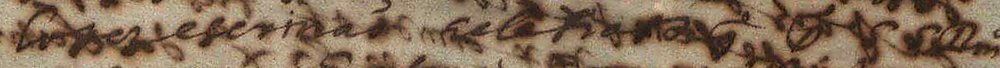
lopes escriuaõ eclesiastiqo p̄ S S Rma
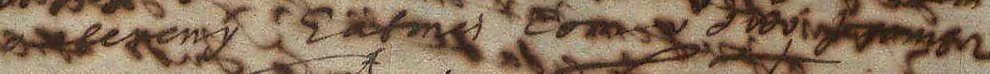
o escreuy E asinei com o dito prouisor
